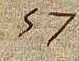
57
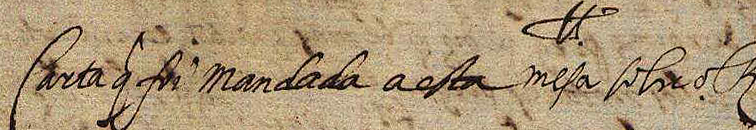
Carta q̄ foi mandada a esta mesa sobre o R
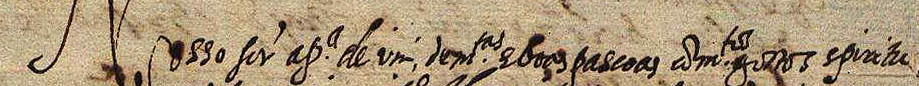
Nosso sor̄ a p.a de vm de m.tas E boas pascoas cō m.tos gostos spiritu
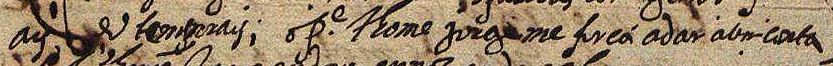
ais E temporais, o p.e Thome jorge me força a dar a vm conta
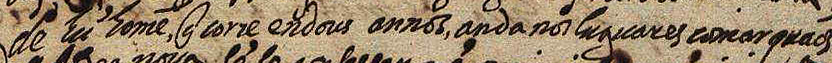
de hū homē, q̄ corre en dous annos, anda nos luguares comarquaõs
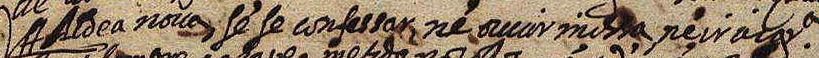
A Aldea noua, sē se confessar nē ouuir missa, nē ir a igr.a
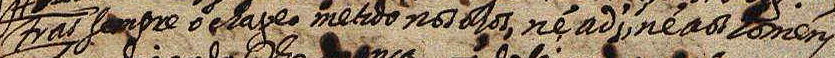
tras sempre o chapeo metido nos olhos, nē a ds̄ nē aos homens
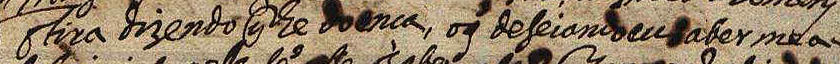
o tira dizendo q̄ he doença, o q̄ deseiando eu saber me a
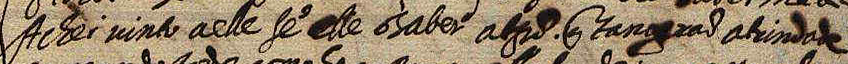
Achei iunto a elle sē elle o saber a tpō. q̄ tangeraõ a trindade
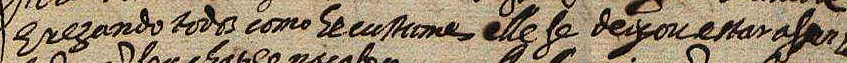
E rezando todos como he custume elle se deixou estar assen
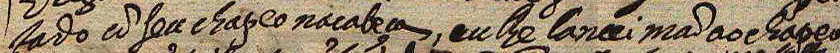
tado cō seu chapeo na cabeça, eu lhe lancei maõ ao chapeo
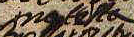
na testa
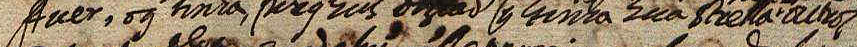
A uer, o q̄ tinha, porq̄ hūs diziaõ q̄ tinha huā strella outros
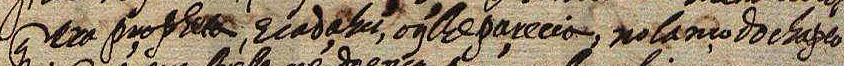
q̄ era propheta, E cada hū, o q̄ lhe parecia, no lanço do chapeo
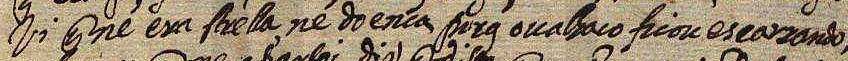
Vi q̄ nē era strella nē doença porq̄ o ualhaco ficou escarrando,
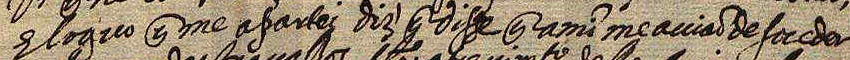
E loguo q̄ me apartei diz q̄ disse q̄ a mī me auiaõ de soceder
